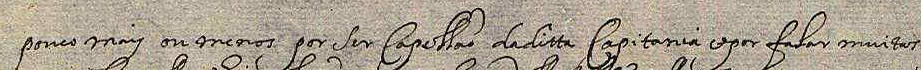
pouco mais ou menos por Ser Capellaõ da ditta Capitania e por falar muitas
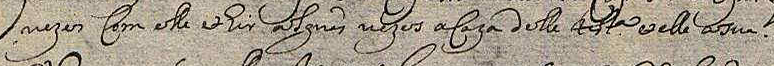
uezes Com elle e hir alguās uezes a Caza delle testa e elle a sua.
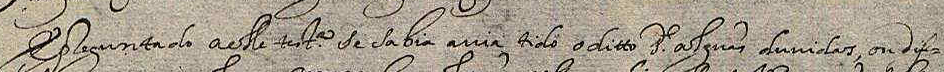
E preguntado a elle test.a se sabia auia tido o ditto P.e alguās duuidas, ou dif
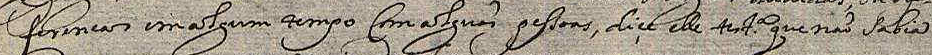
ferenças em algum tempo Com alguas̄ pessoas, dice elle test.a que não sabia
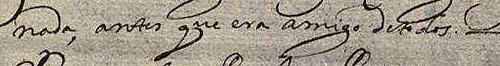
nada, antes que era amigo de todos.
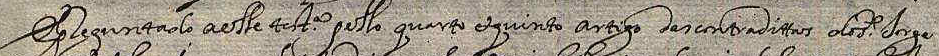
E preguntado a elle test.a pello quarto e quinto artigo das contradittas do d.o Iorge
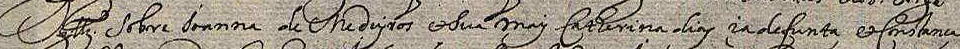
gllz̄. Sobre Ioanna de Medeyros e sua may Catherina dias ia defunta, e Constança
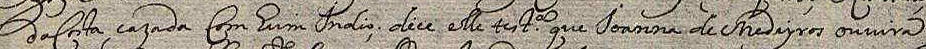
da Costa cazada Com hum Indio, dice elle test.a que Ioanna de Medeyros ouuira
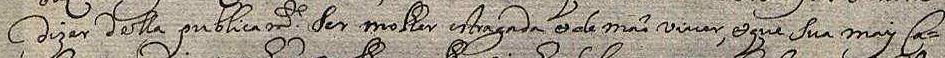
dizer della publicam.te ser molher estragada, e de mao viuer, e que sua may Ca
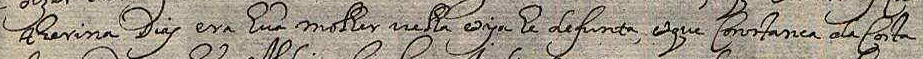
therina Dias era huā molher uelha, e ya he defunta, e que Constança da Costa
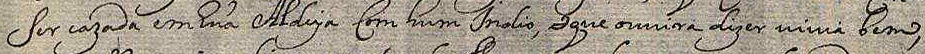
ser cazada em huā Aldeya Com hum Indio, e que ouuira dizer uiuia bem,
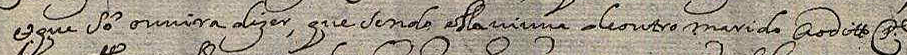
e que só ouuira dizer, que sendo ella uiuua de outro marido ao ditto P.e
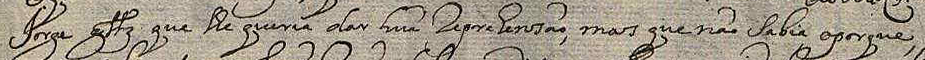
Jorge gll̄z que lhe queria dar huā Reprehensaõ, mas que não Sabia o porque,
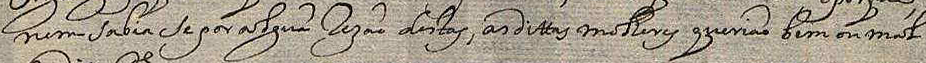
nem sabia se por alguā Rezaõ destas, as dittas molheres queriaõ bem, ou mal
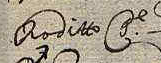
ao ditto P.e
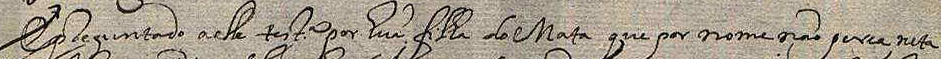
E preguntado a elle testa por huā filha do Mata que por nome naõ perca, neta
